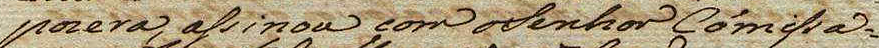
pozera, assinou com o Senhor Cōmissa
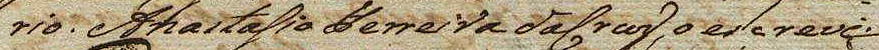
rio. Anastasio Ferreira da Cruz, o escrevi
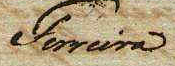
Ferreira
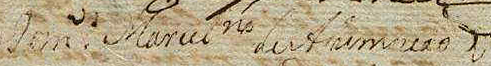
Dom.os Marcel.no de Assumpçao
